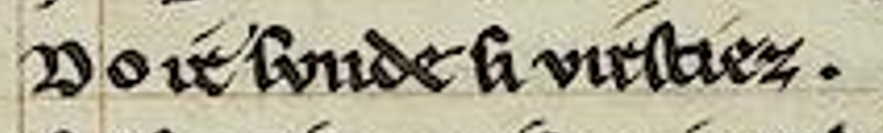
Do ir ſvnde ſi virſtiez.
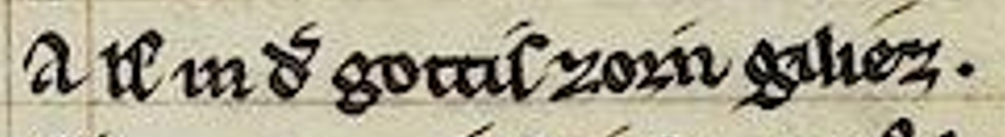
Alſ in d(er) gottiſ zorn giliez.
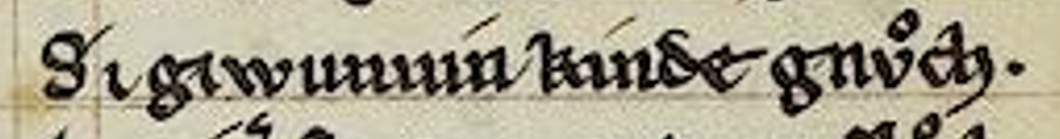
Si giwunnin kinde gnv°och.
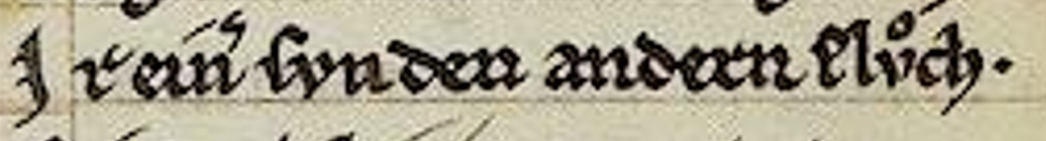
Ir ein(er) ſvn den andern ſlv°och.
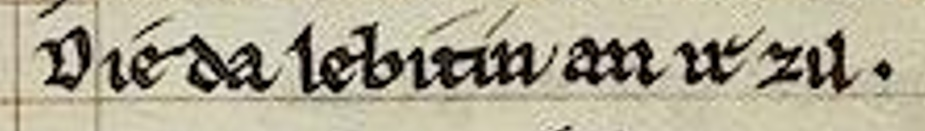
Die da lebitin an ir zil.
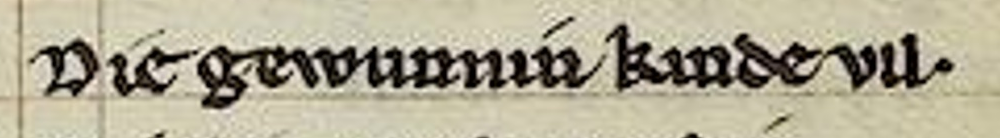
Die gewunnin kinde vil.
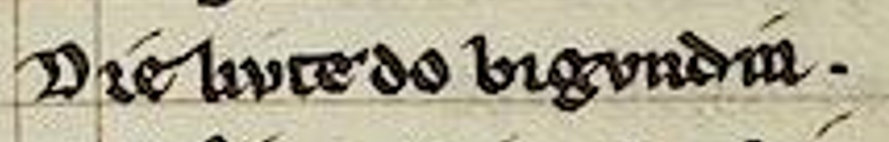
Die livte do bigvndin.
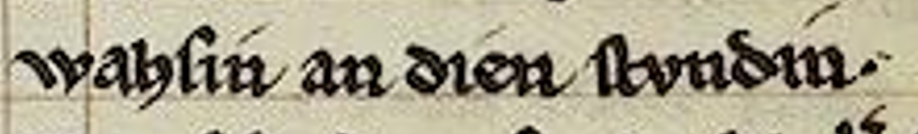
Wahſin an dien ſtvndin.
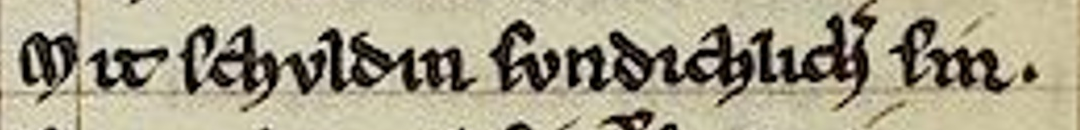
Mit ſchvldin ſvndichlich(er) ſin.
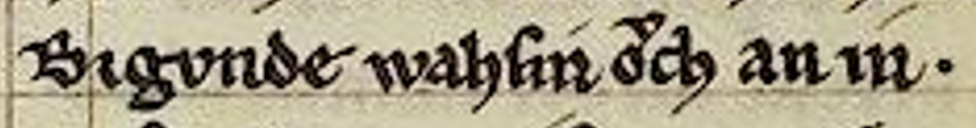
Bigvnde wahſin o°vch an in.
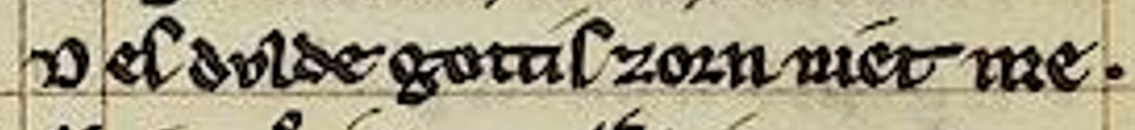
Deſ dvlde gottiſ zorn niet me.
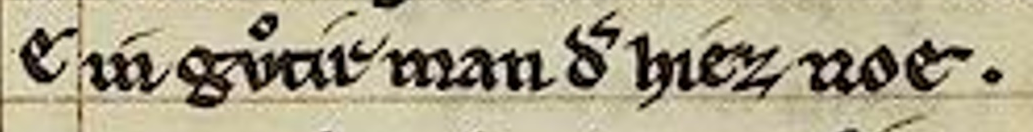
Ein gv°otir man d(er) hiez noe.
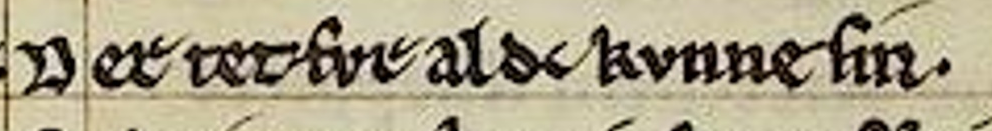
Der tet fvr al d(az) kvnne ſin.
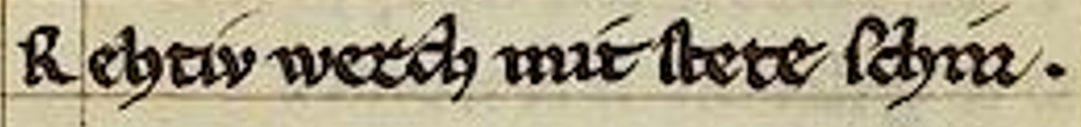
Rehtiv werch mit ſtete ſchin.
